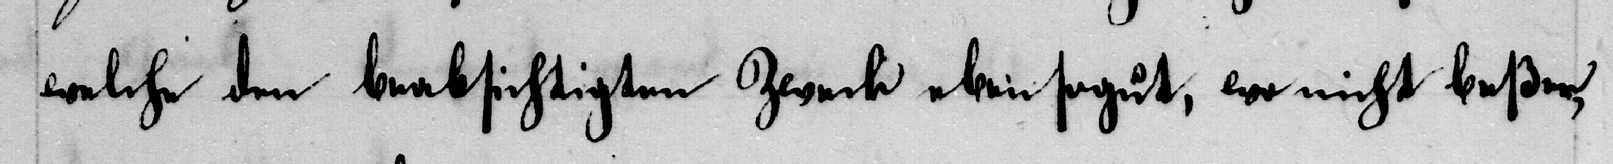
welche den beabsichtigten Zweck ebensogut, wo nicht beßer,
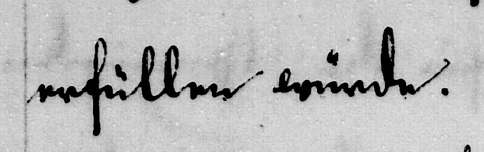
erfüllen würde.
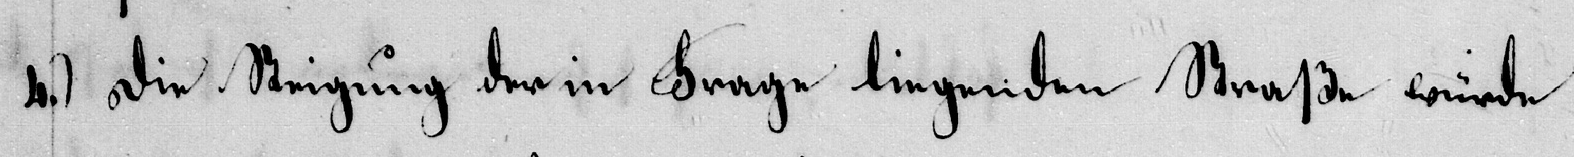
4.) Die Neigung der in Frage liegenden Straße würde
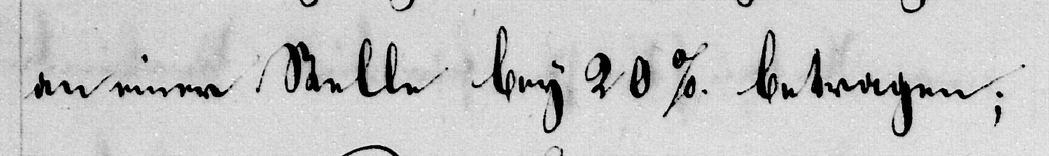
an einer Stelle bey 20% betragen;
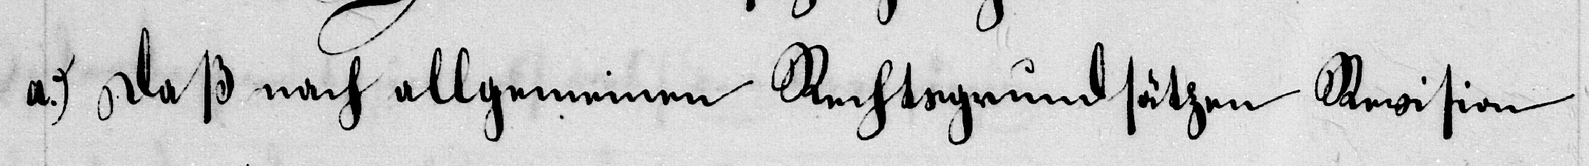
a.) Daß nach allgemeinen Rechtsgrundsätzen Revision
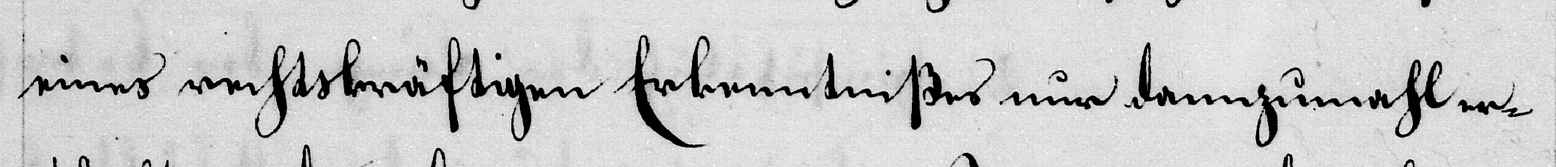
eines rechtskräftigen Erkenntnißes nur dannzumahl er¬
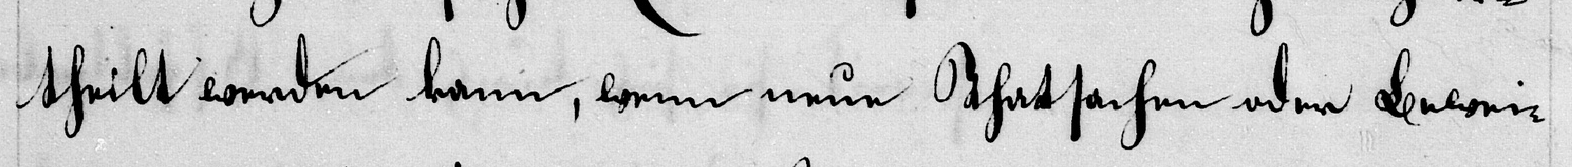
theilt werden kann, wenn neue Thatsachen oder Bewei¬
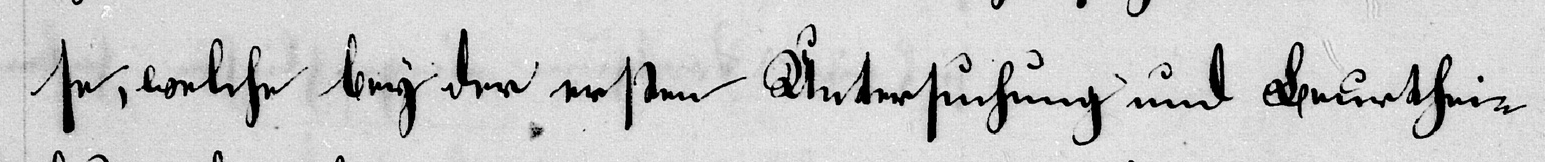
se, welche bey der ersten Untersuchung und Beurthei¬
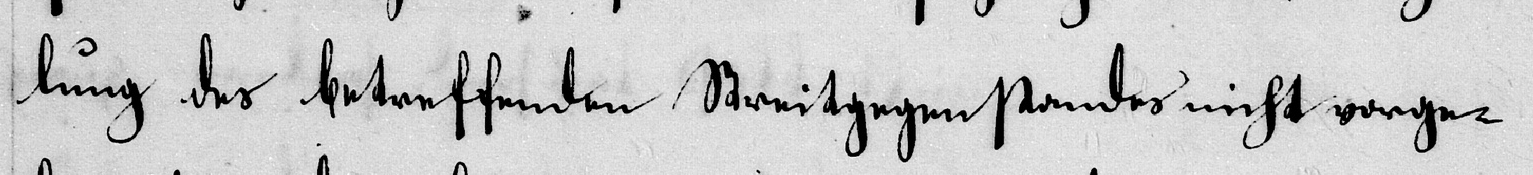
lung des betreffenden Streitgegenstandes nicht vorge¬
